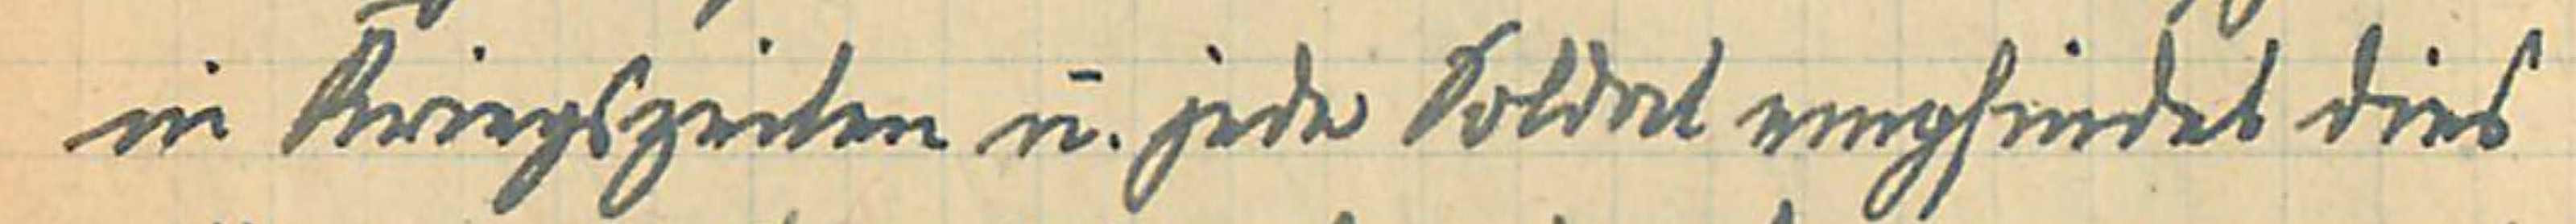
in Kriegszeiten u. jeder Soldat empfindet dies
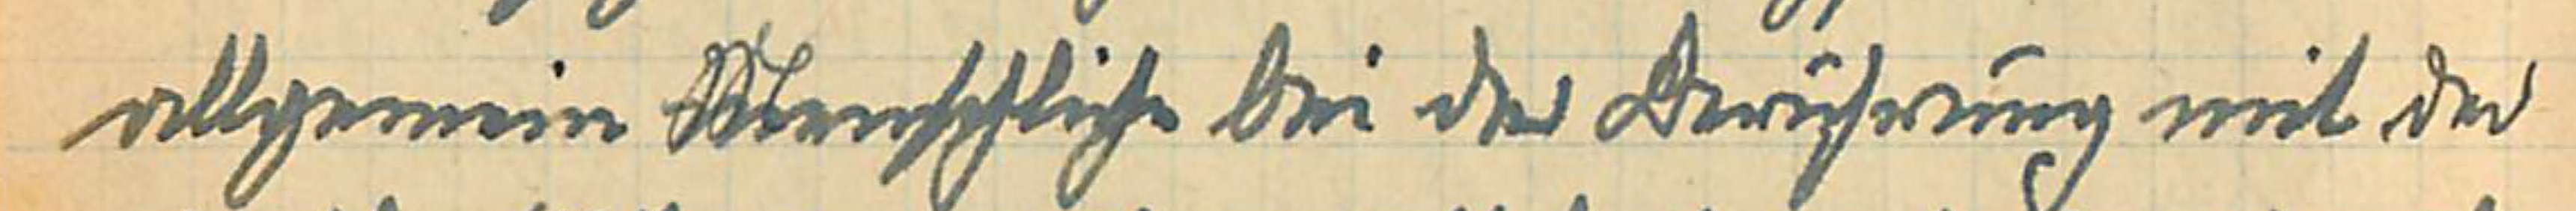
allgemein Menschliche bei der Berührung mit der
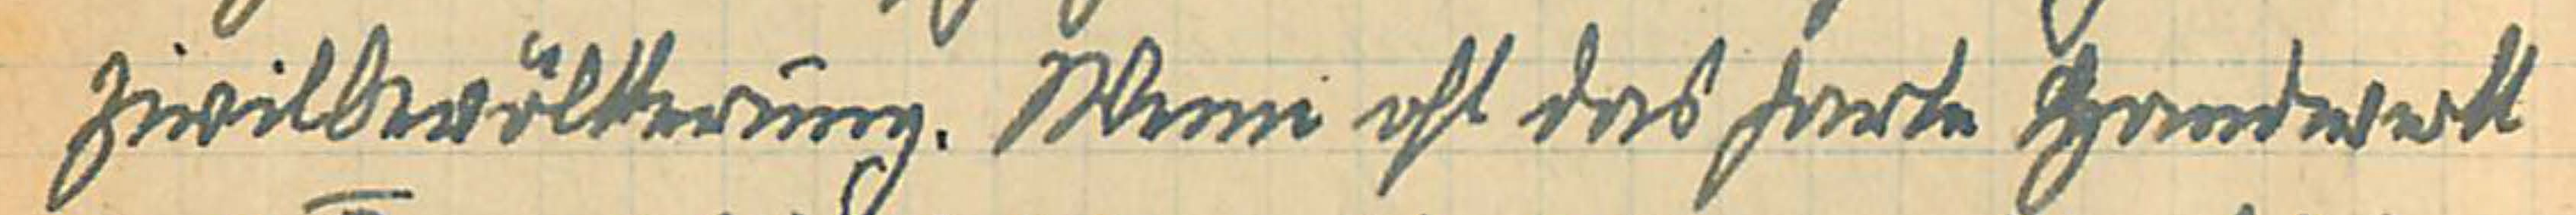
Zivilbevölkerung. Wenn oft das harte Handwerk
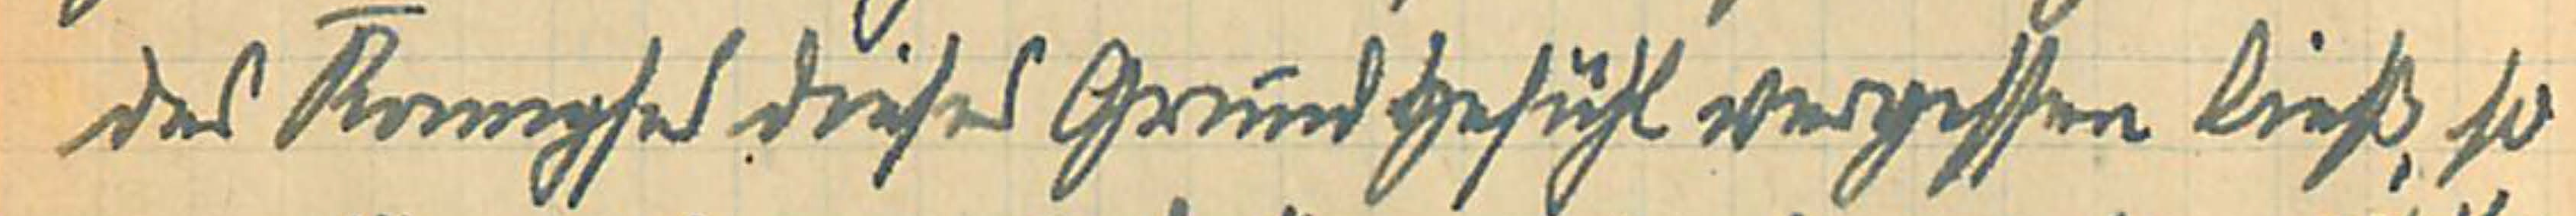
des Kampfes dieses Grundgefühl vergessen ließ, so
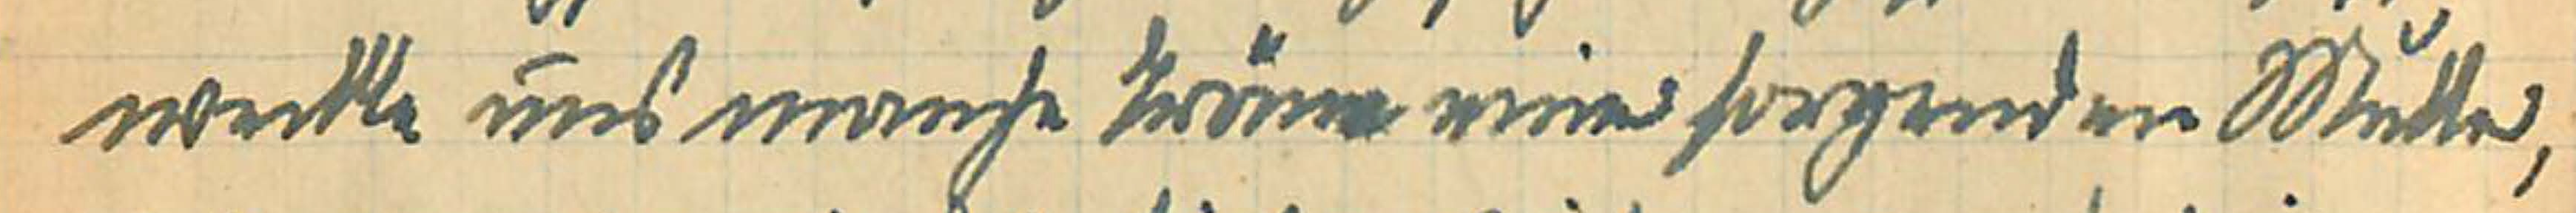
weckte uns manche Träne einer sorgenden Mutter,
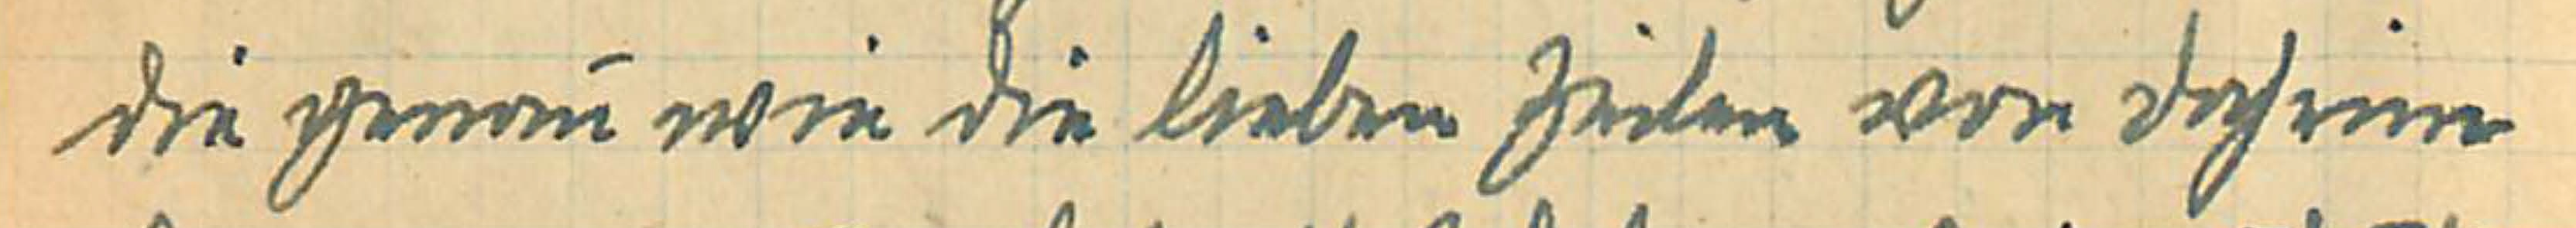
die genau wie die lieben Zeilen von daheim
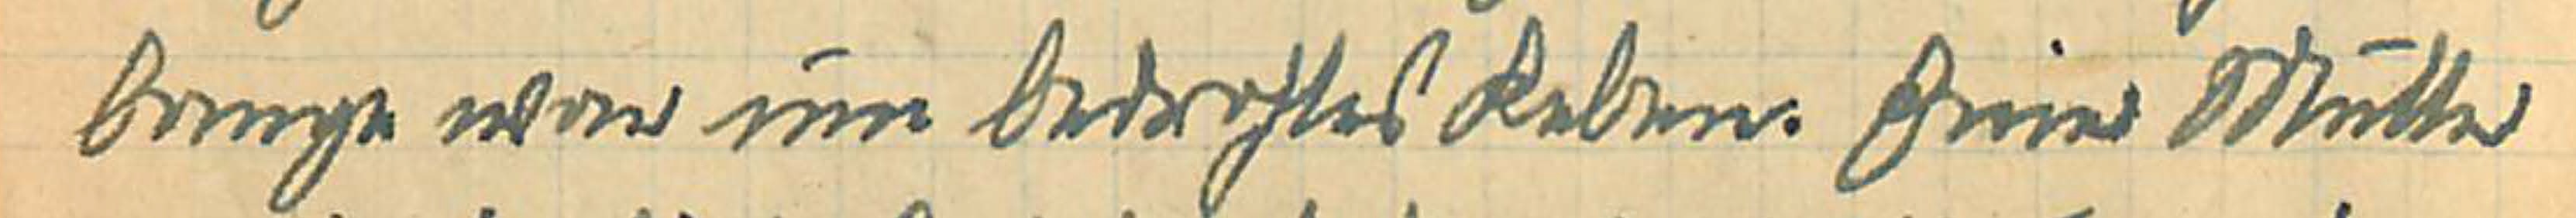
bange war um bedrohtes Leben. Einer Mutter
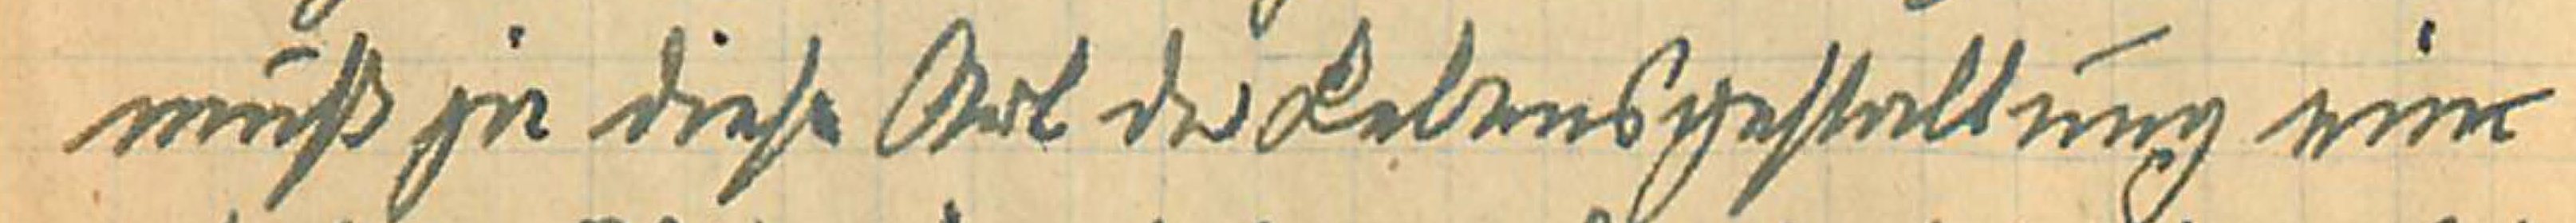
muß ja diese Art der Lebensgestaltung eine
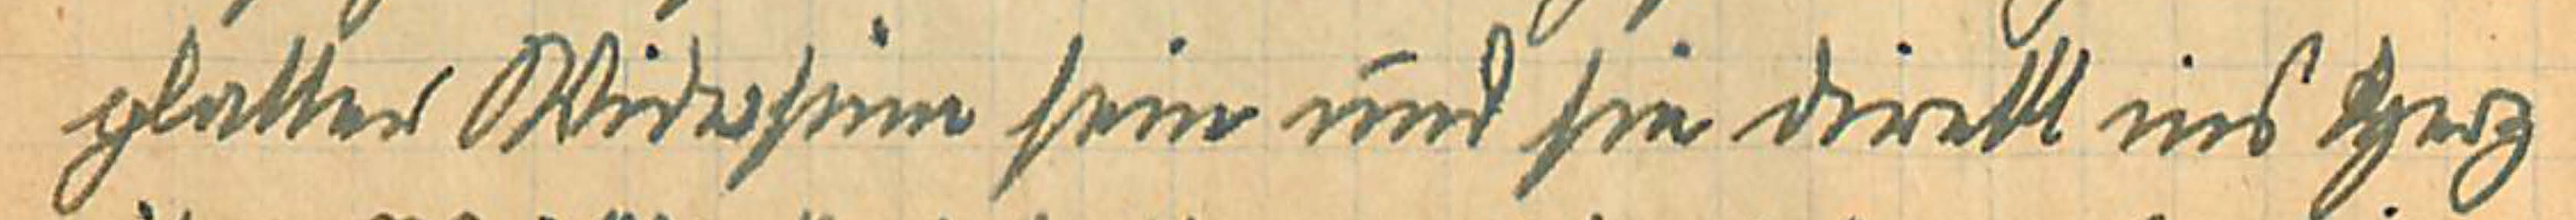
glatter Widersinn sein und sie direkt ins Herz
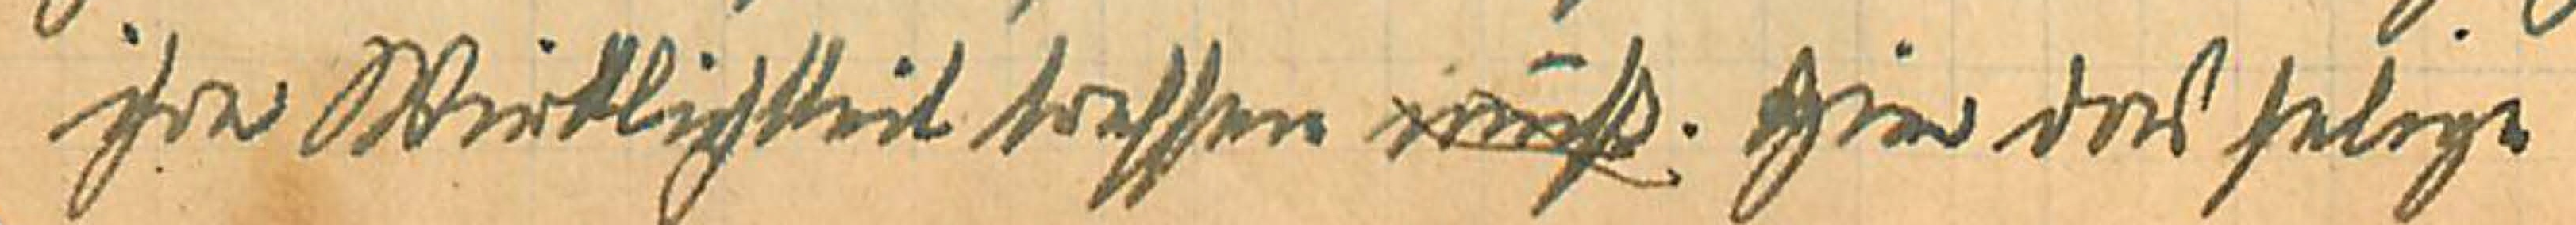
ihrer Wirklichkeit treffen muß. Hier das selige
